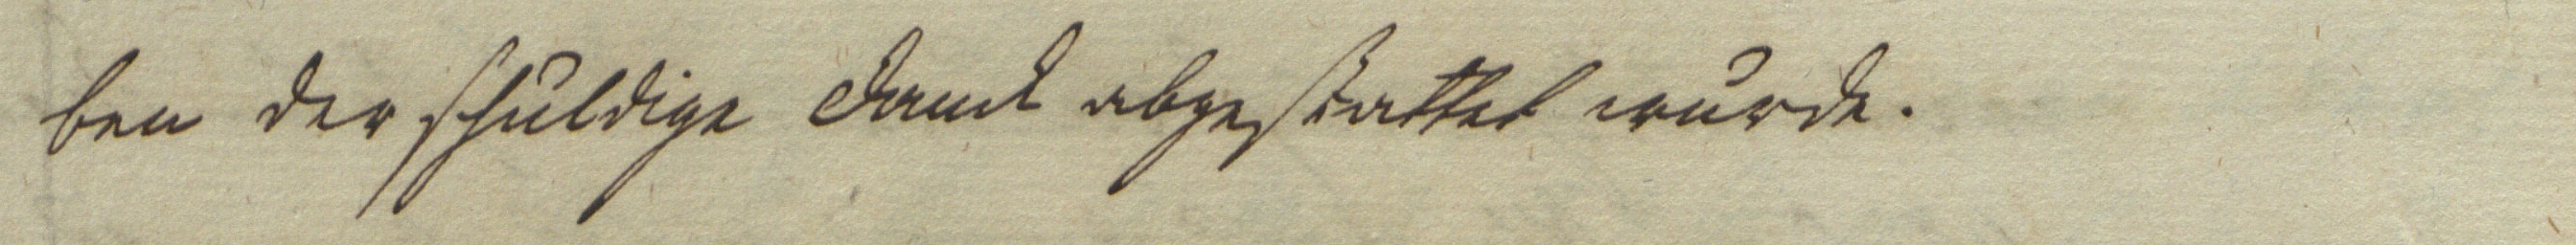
ben der schuldige Dank abgestattet wurde.
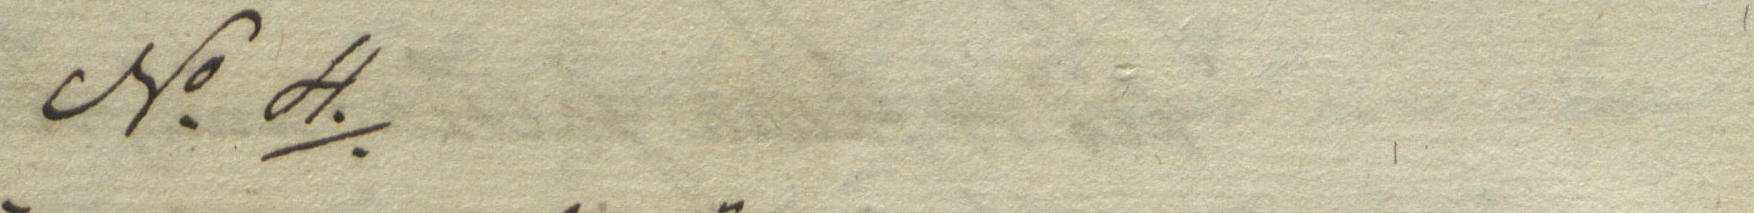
No. 4./.
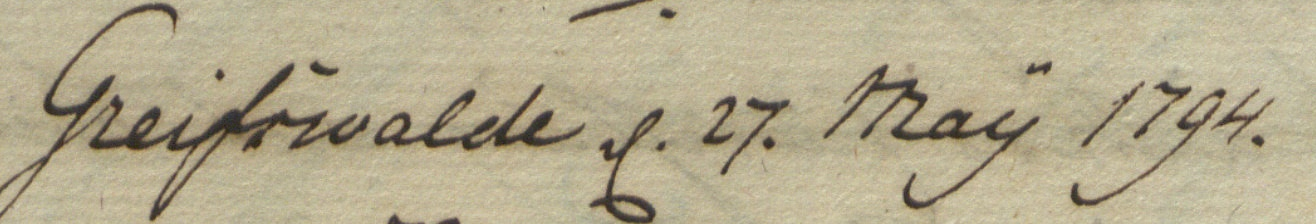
Greifswalde d. 27. May 1794.
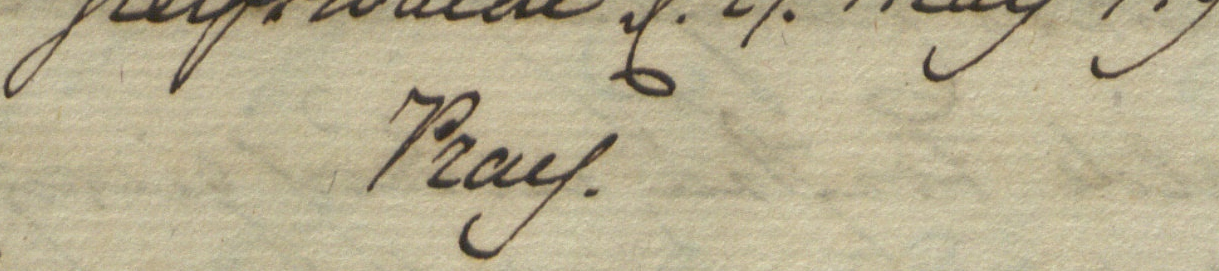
Praes.
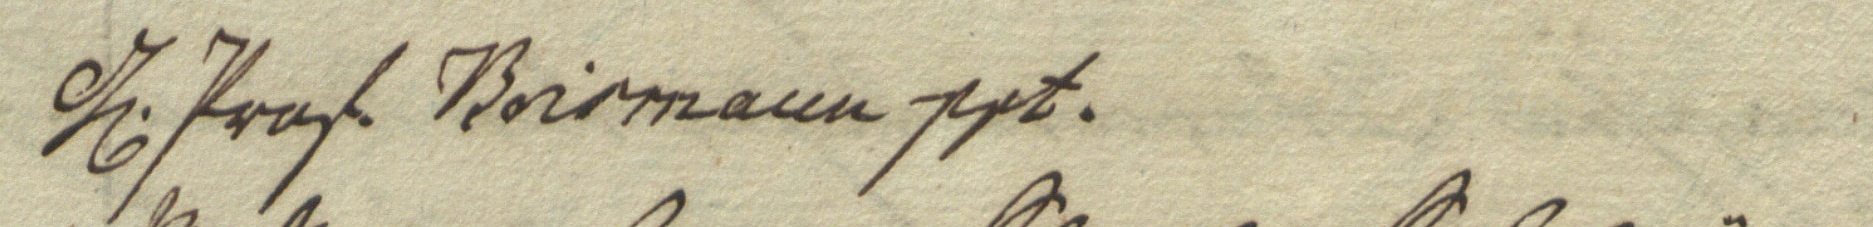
dh. Prof. Bismann ppt.
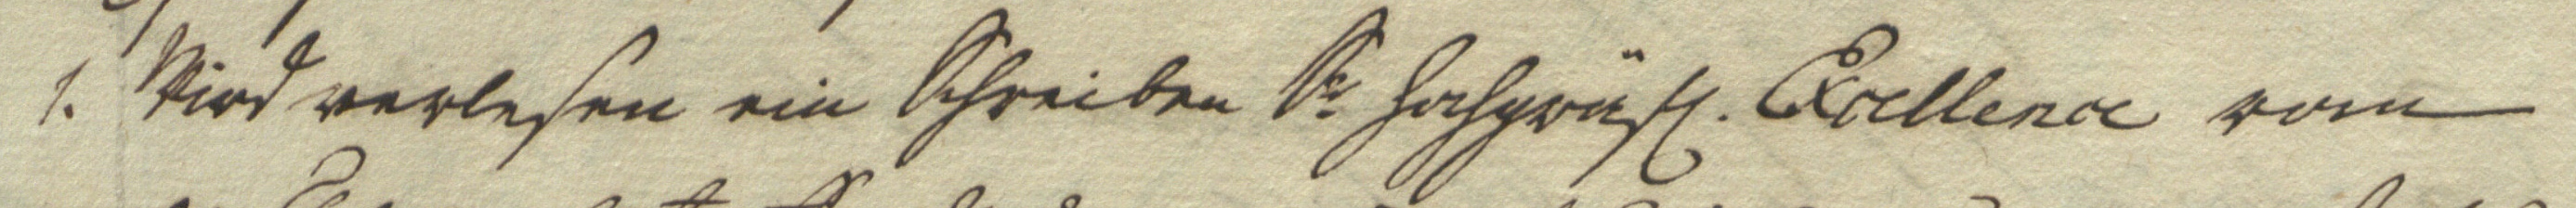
1. Wird verlesen ein Schreiben Sr. hochgräfl. Excellence vom
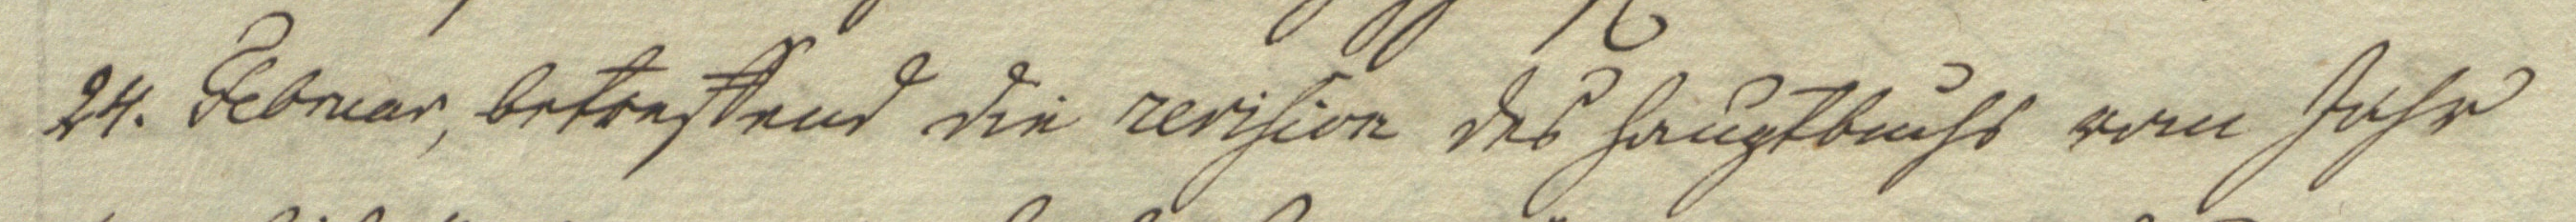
24. Februar, betreffend die revision des Hauptbuchs vom Jahr
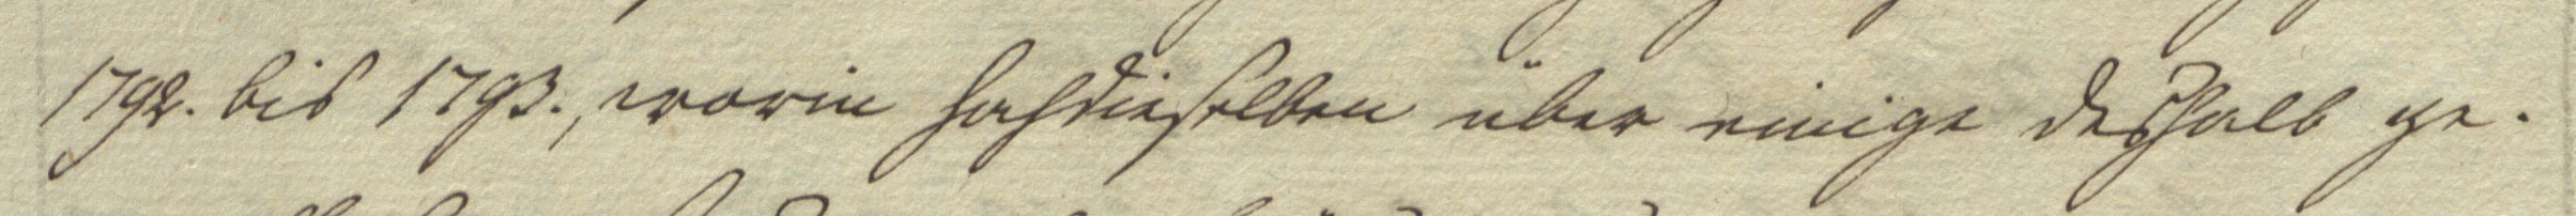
1792 bis 1793, worin hochdieselben über einge deshalb ge¬
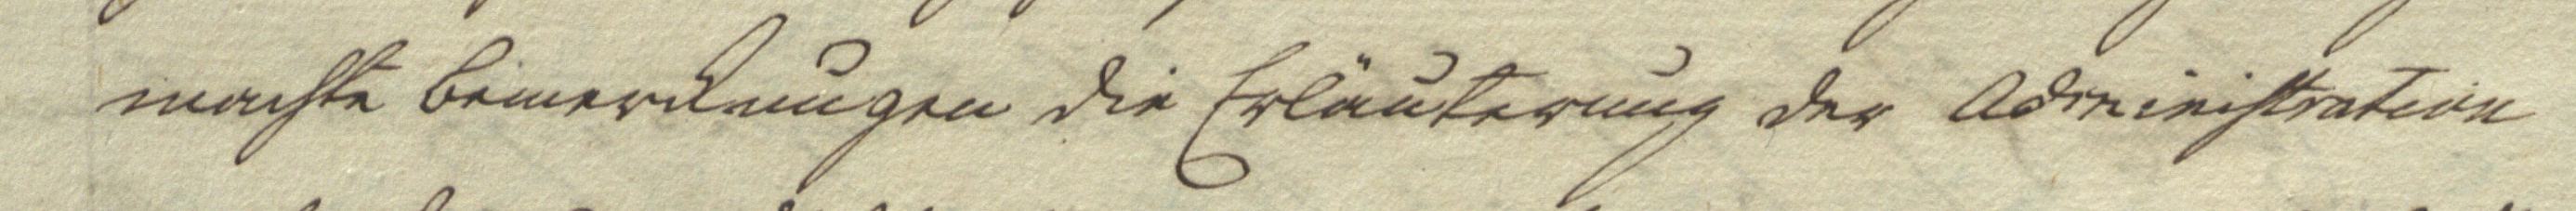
machte Bemerkungen die Erläuterung der Administration
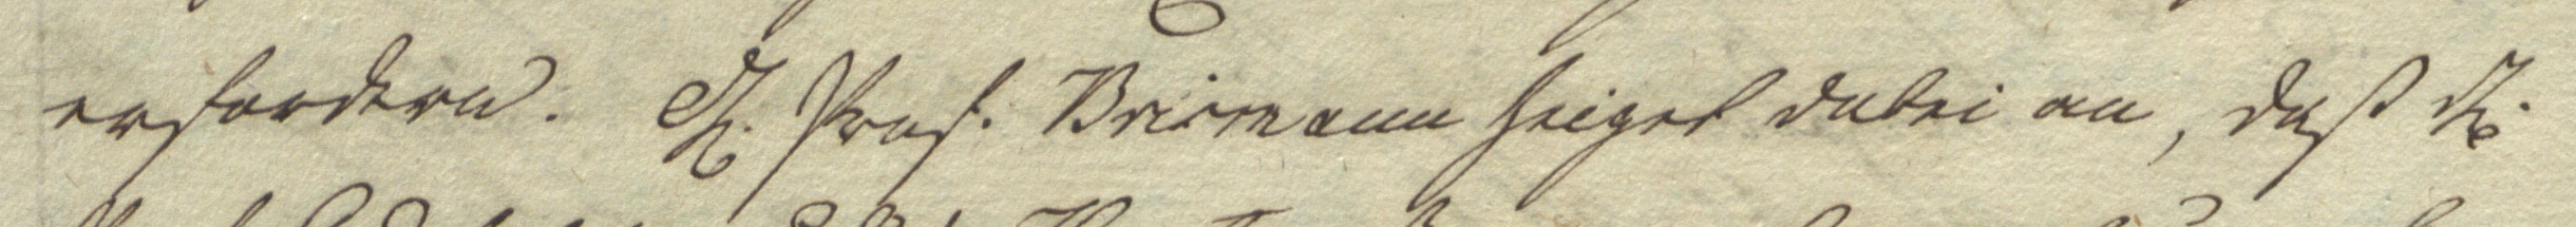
erfordern. dh. Prof. Brismann zeiget dabei an, daß dh.
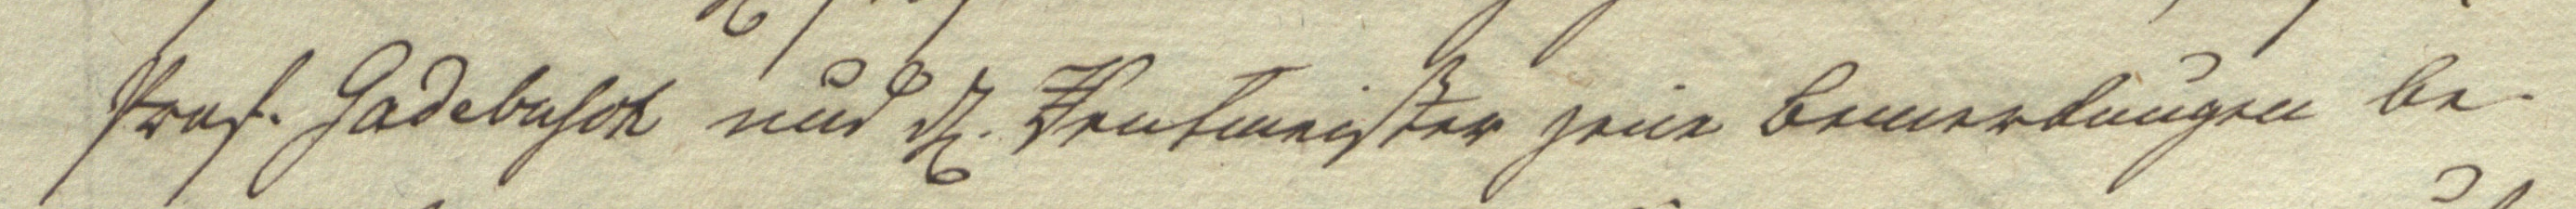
Prof. Gadebusch und dh. Rentmeister jene Bemerkungen be¬
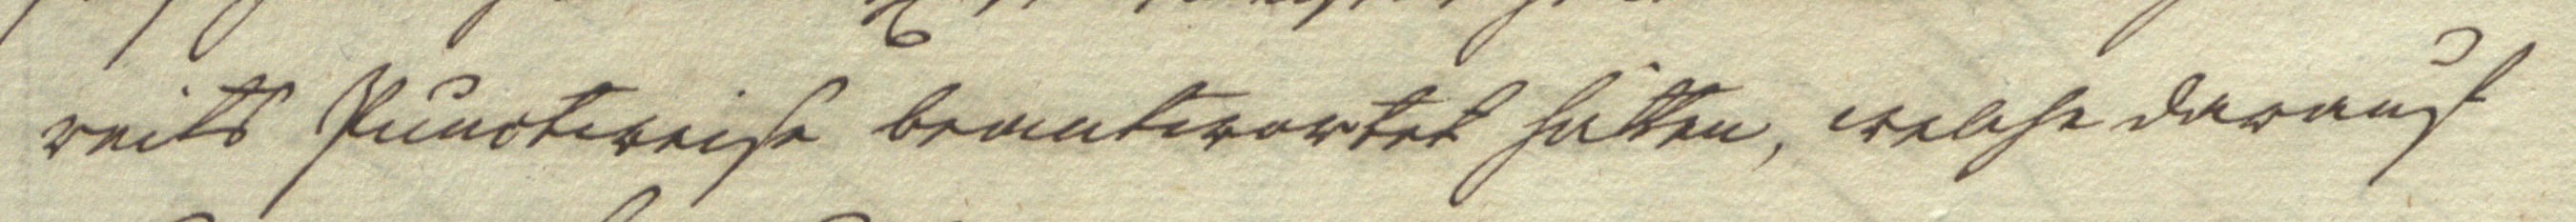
reits Punctweise beantwortet hätten, welche darauf
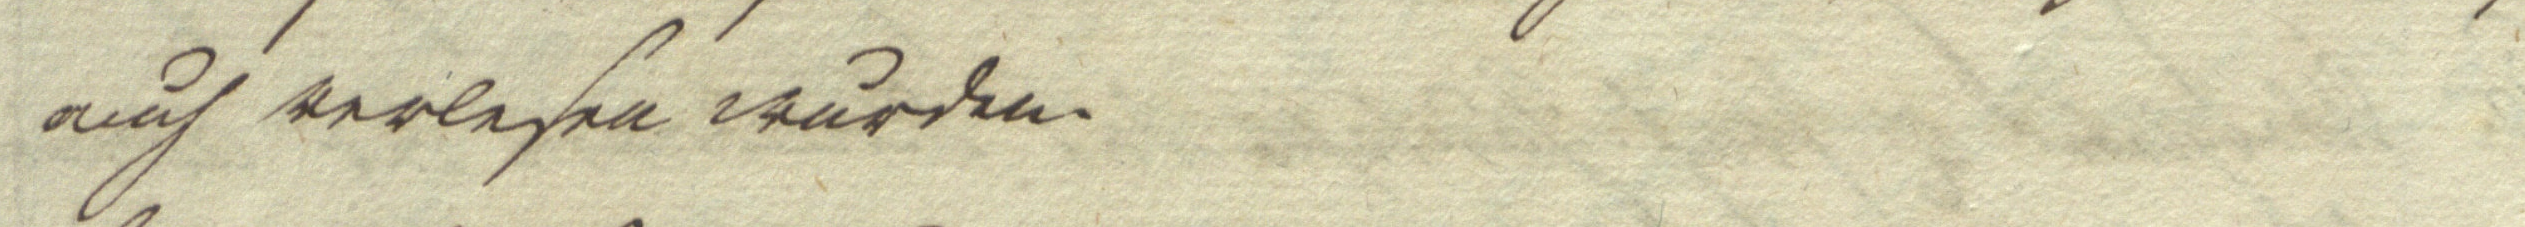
auch verlesen wurden.
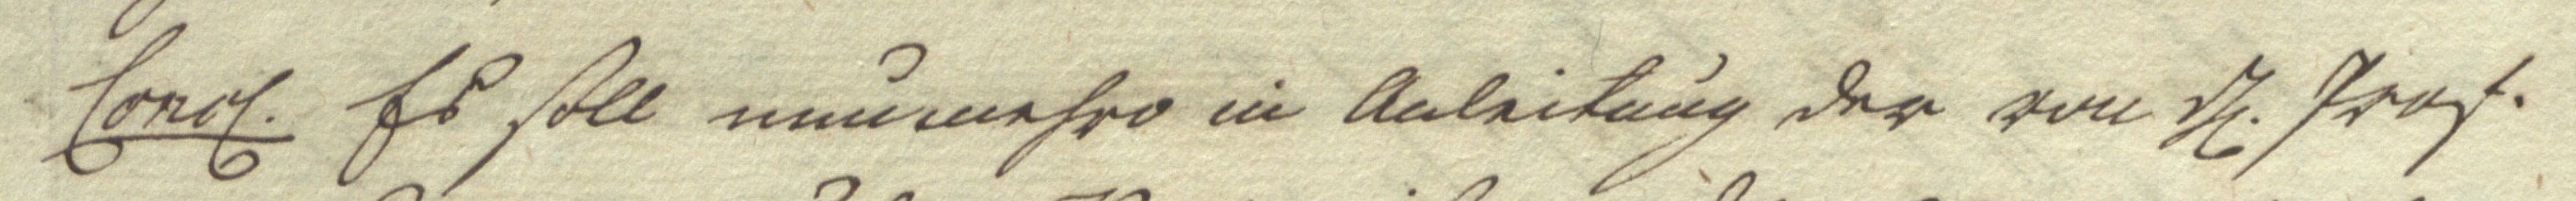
Concl. Es soll nunemehro in Anleitung der von dh. Prof.
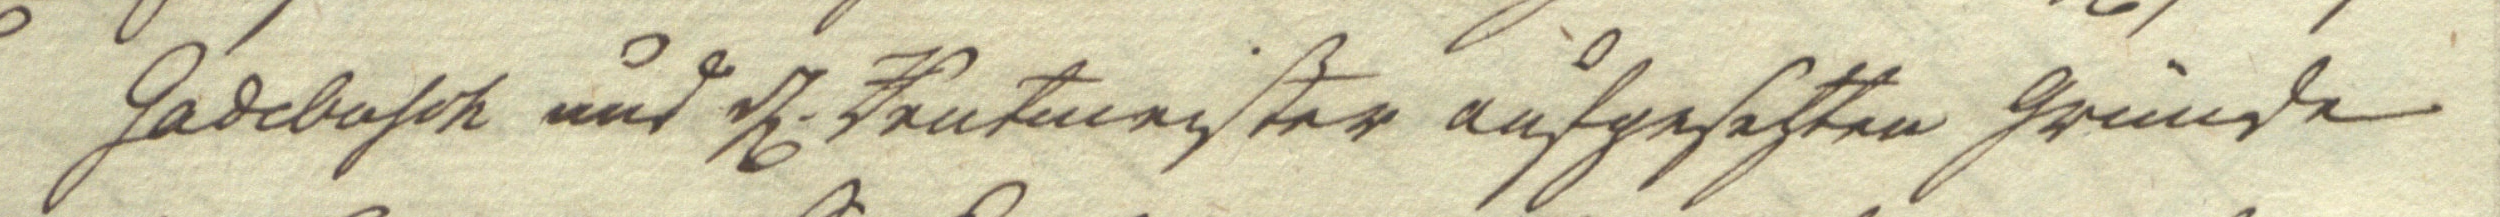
Gadebusch und dh. Rentmeister aufgesetzten Gründe
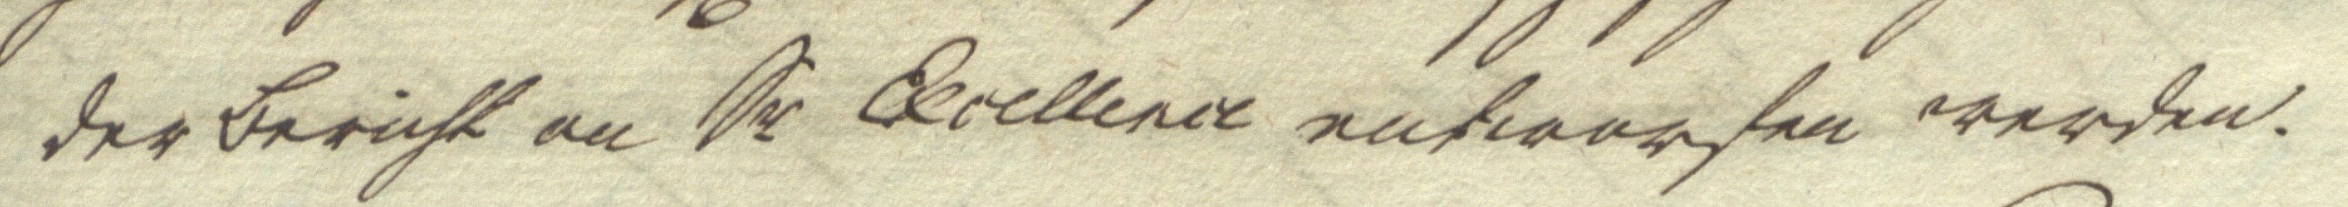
der Bericht an Sr. Excellence entworfen werden
